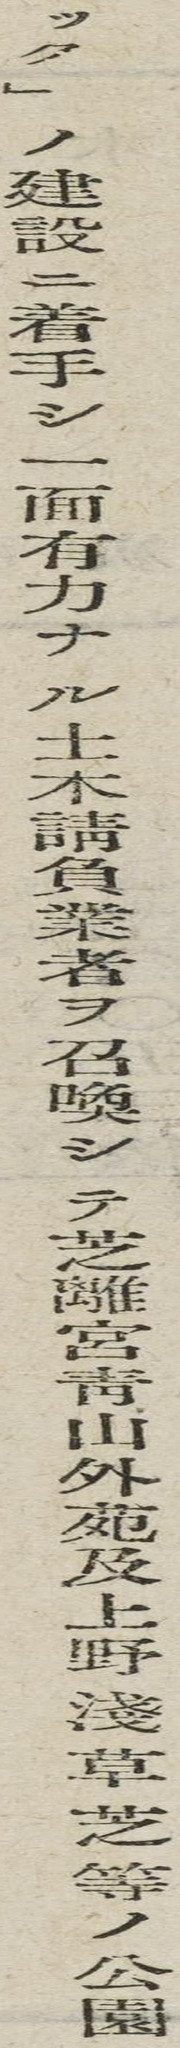ック」ノ建設ニ着手シ一面有力ナル土木請負業者ヲ召喚シテ芝離宮青山外苑及上野浅草芝等ノ公園
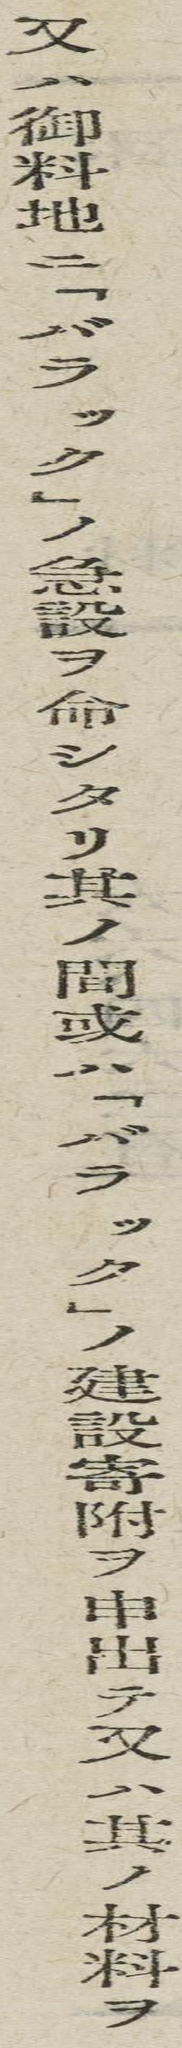又ハ御料地ニ「バラック」ノ急設ヲ命シタリ其ノ間或ハ「バラック」ノ建設寄附ヲ申出テ又ハ其ノ材料ヲ
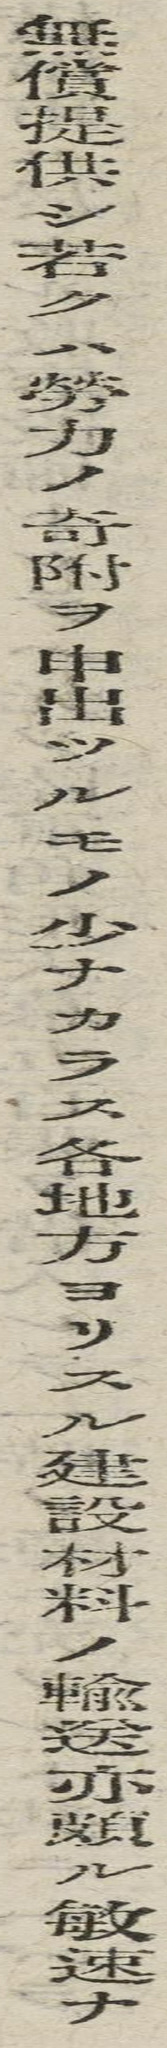無償提供シ若クハ労力ノ寄附ヲ申出ツルモノ少ナカラス各地ヨリスル建設材料ノ輸送亦頗ル敏速ナ
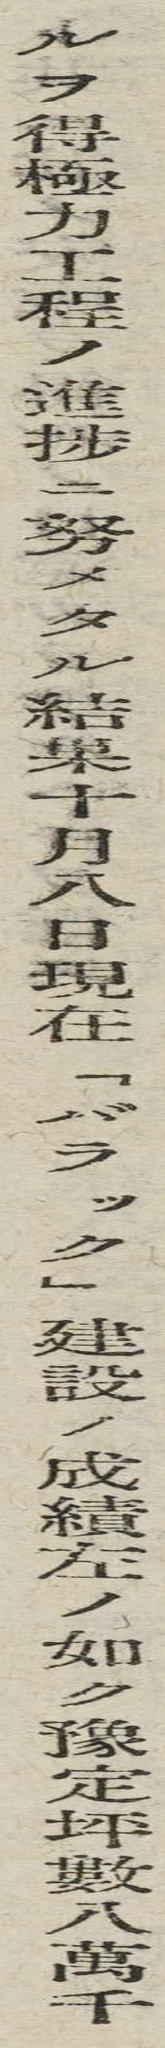ルヲ得極力工程ノ進捗ニ努メタル結果十月八日現在「バラック」建設ノ成績左ノ如ク予定坪数八万千
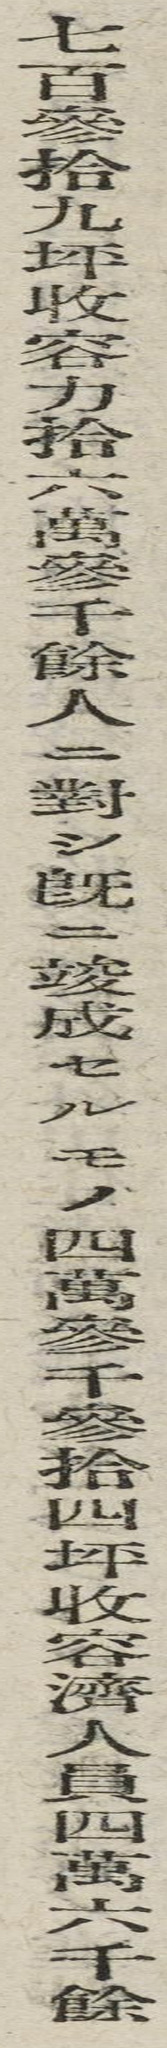七百参拾九坪収容力拾六万参千余人ニ対シ既ニ竣成セルモノ四万参千参拾四坪収容済人員四万六千余
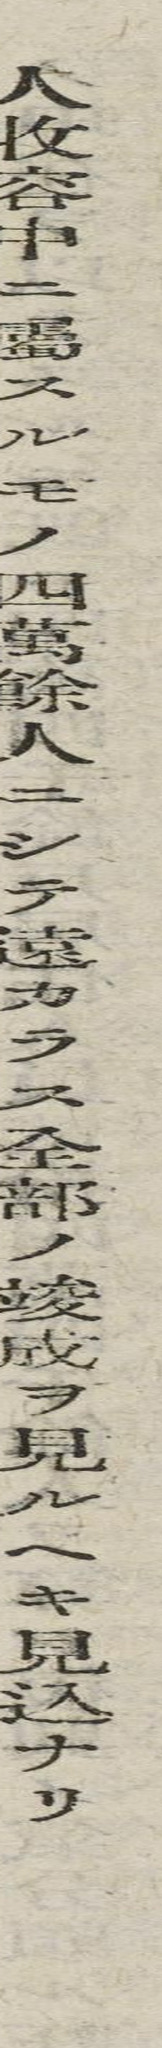人収容中ニ属スルモノ四万余人ニシテ遠カラス全部ノ竣成ヲ見ルヘキ見込ナリ
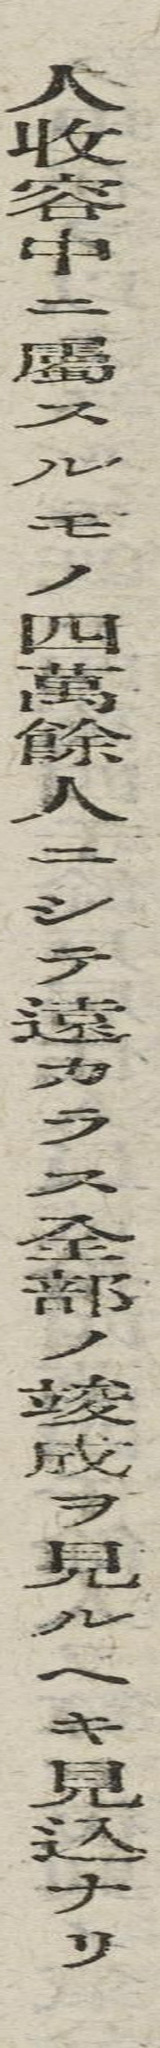人収容中ニ属スルモノ四万余人ニシテ遠カラス全部ノ竣成ヲ見ルヘキ見込ナリ
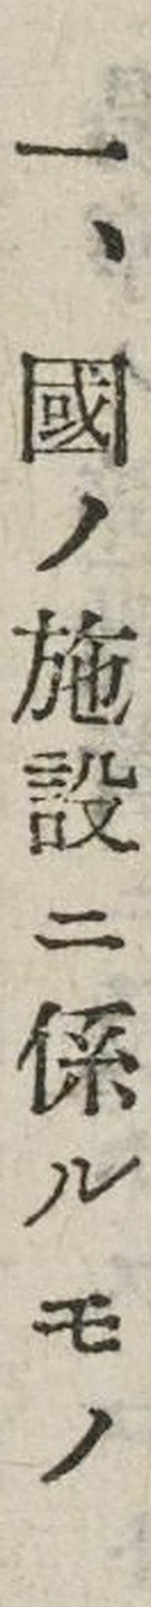一、国ノ施設ニ係ルモノ
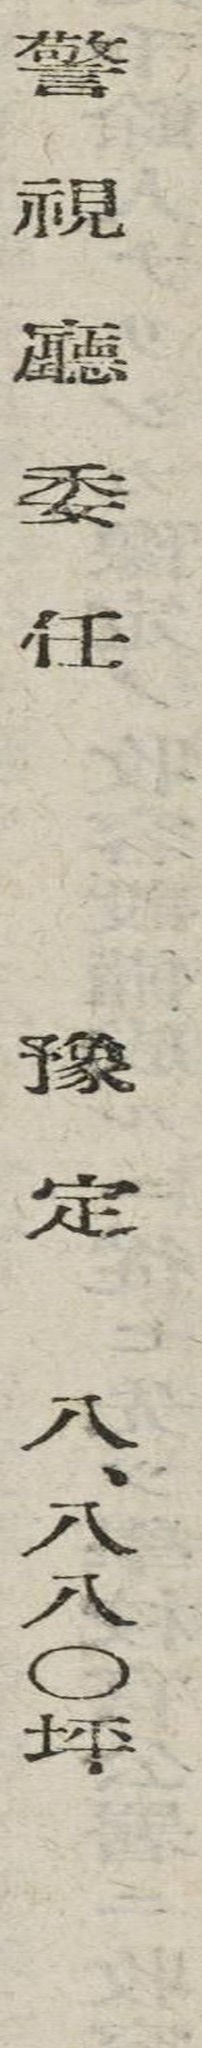警視庁委任予定八、八八〇坪完成
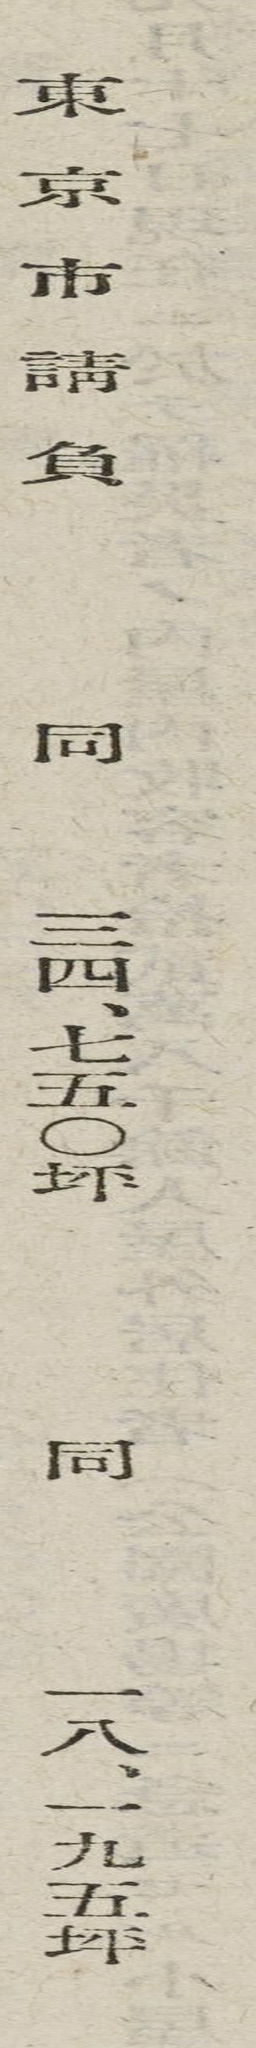東京市請負同三四、七五〇坪同一八、一九五坪
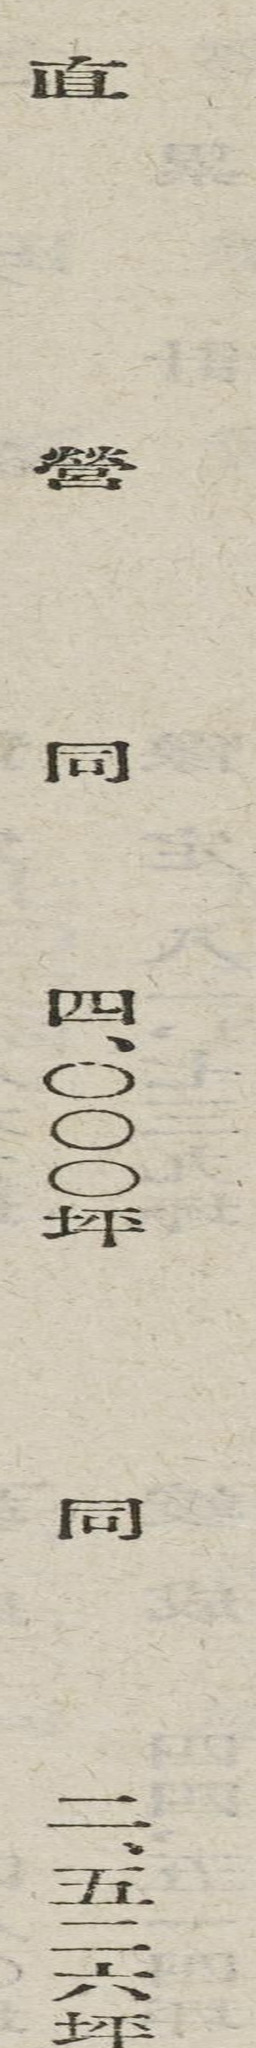直営同四、〇〇〇坪同二、五二六坪
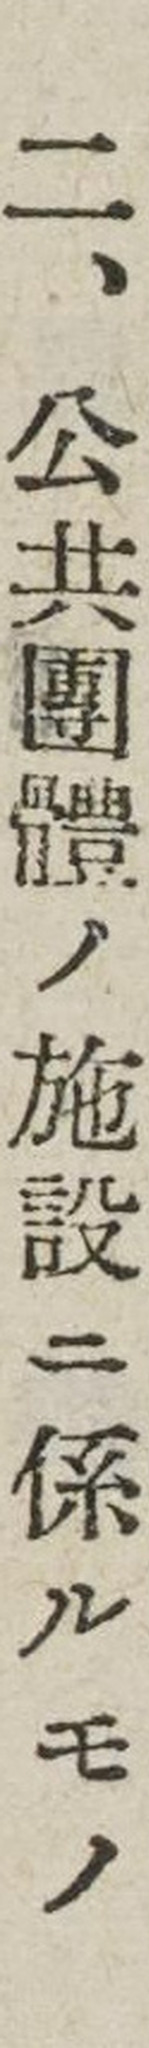ニ、公共団体ノ施設ニ係ルモノ
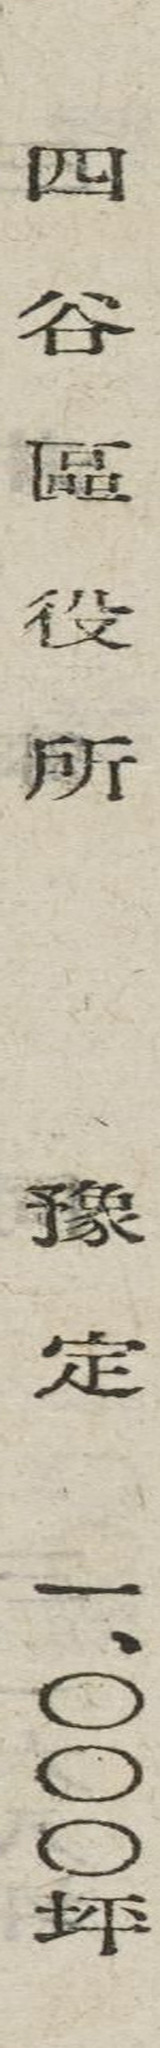四谷区役所予定一、〇〇〇坪完成
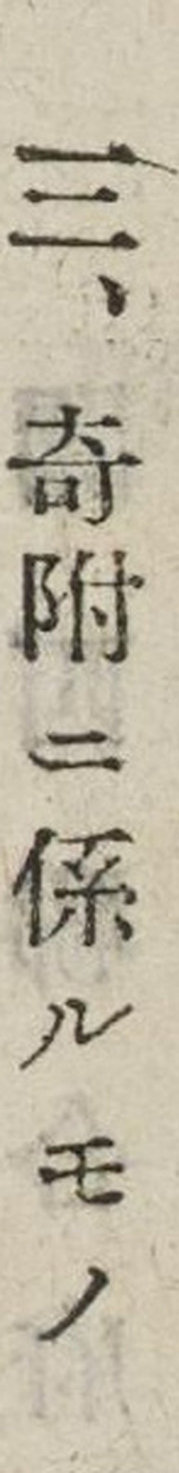三、寄附ニ係ルモノ
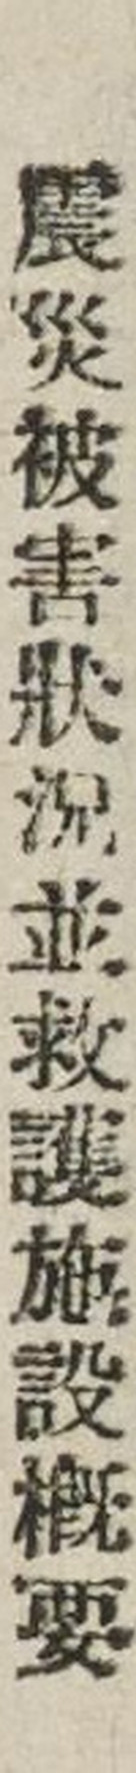震災被害状況並救護施設概要

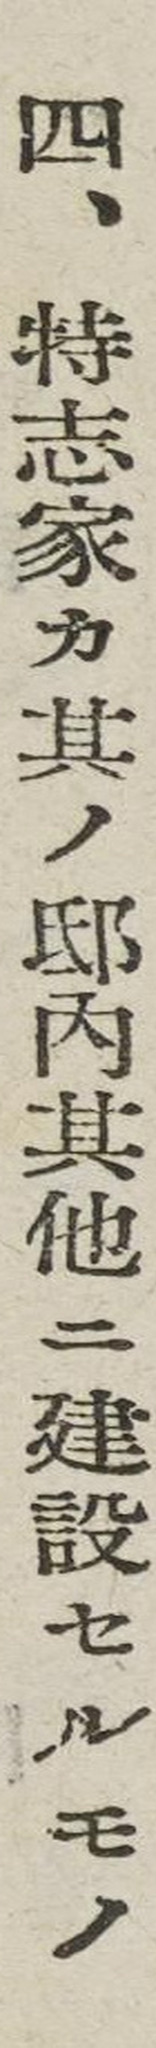四、特志家カ其ノ邸内其他ニ建設セルモノ
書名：震災被害状況並救護施設概要
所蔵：東京大学地震研究所図書室 Earthquake Research Institute Library, The University of Tokyo, JAPAN
